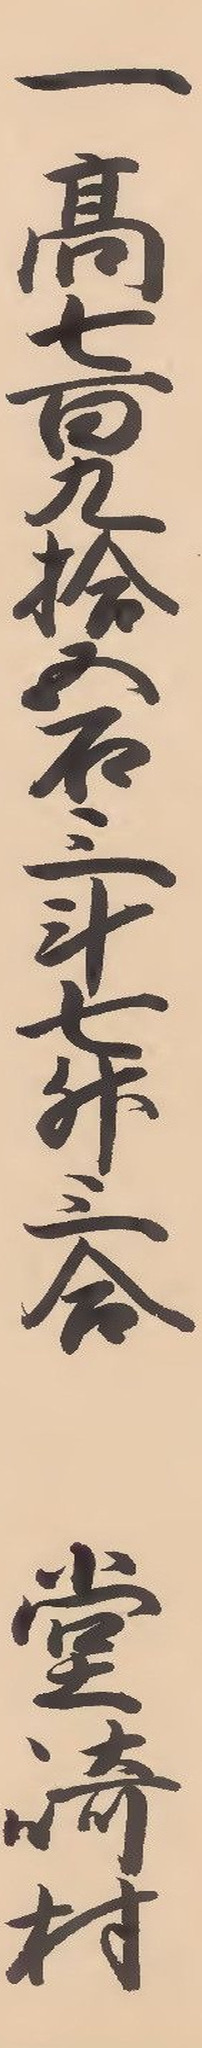一高七百久拾五石三斗七升三合堂崎村
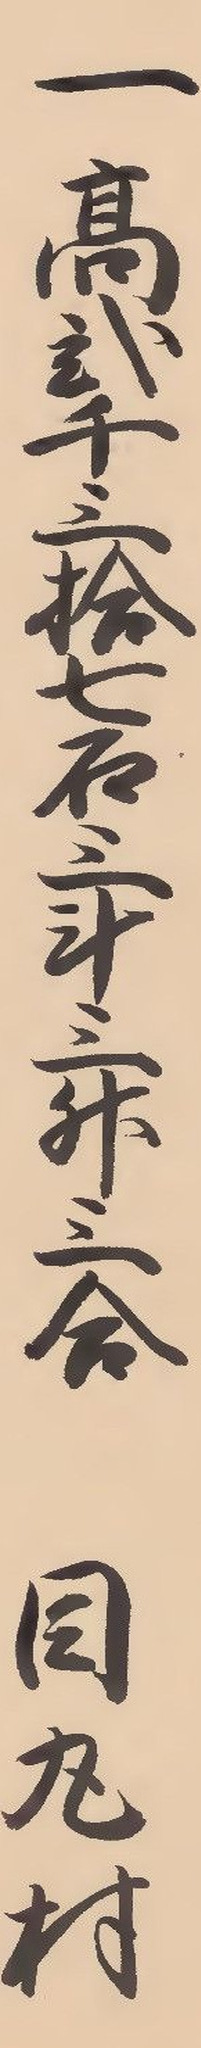一高弐千三拾七石三斗三升三合目丸村
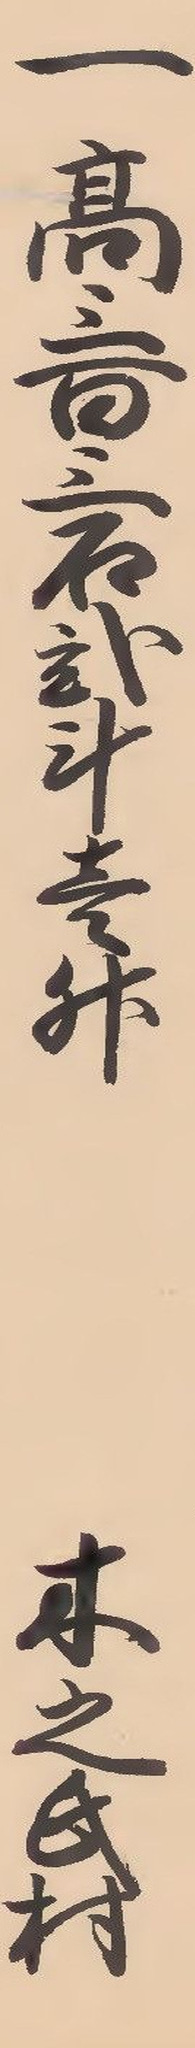一高三百三石弐斗壱升木之氏村
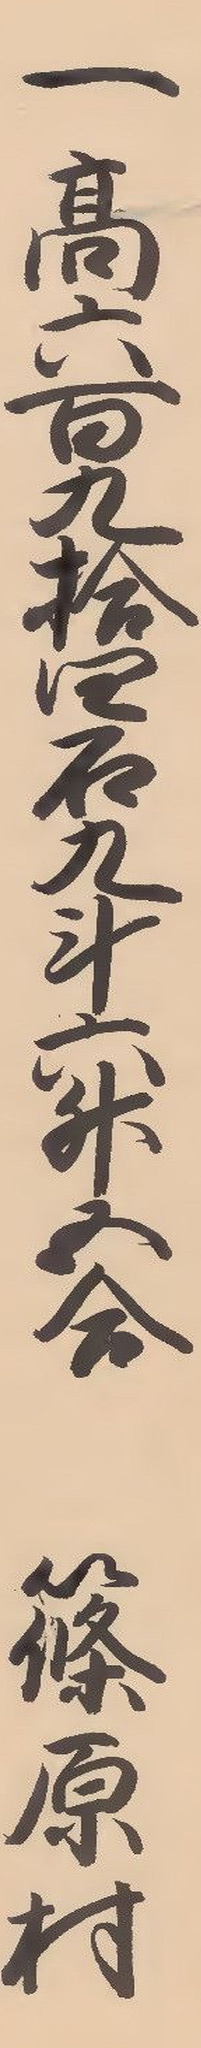一高六百九拾四石九斗六升五合篠原村
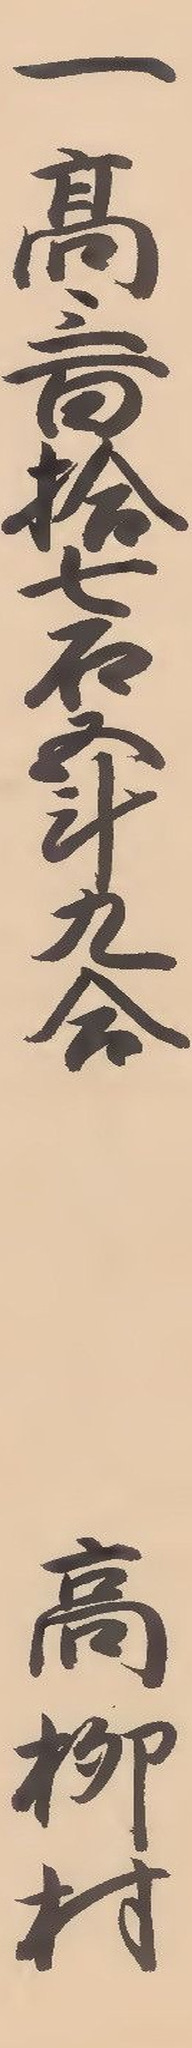一高三百拾七石五斗九合高柳村
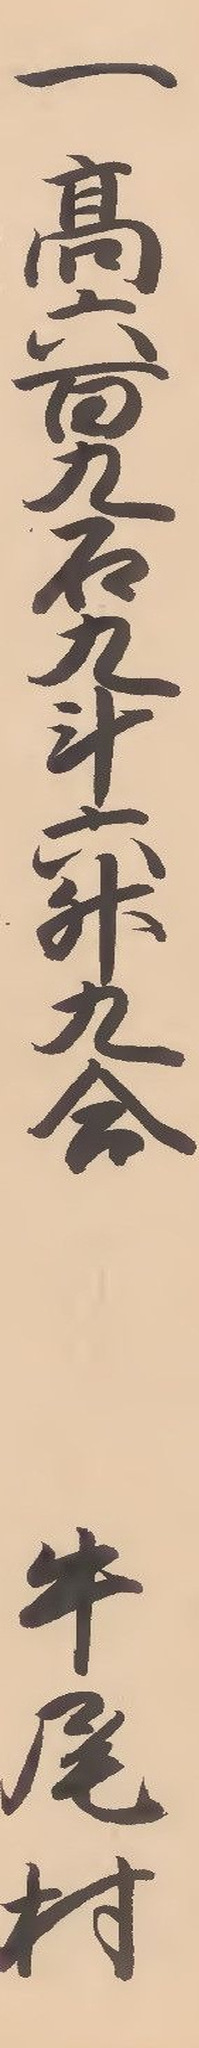一高六百九石九斗六升九合牛尾村
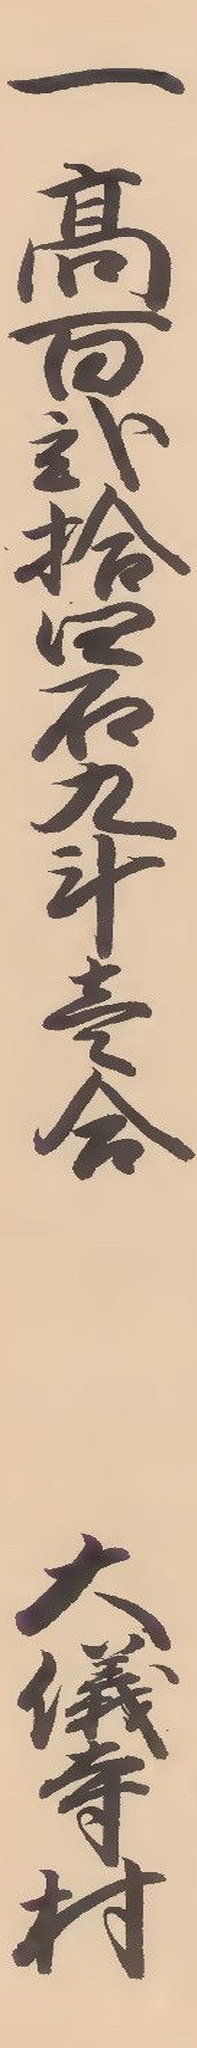一高百弐拾四石九斗壱合大儀寺村

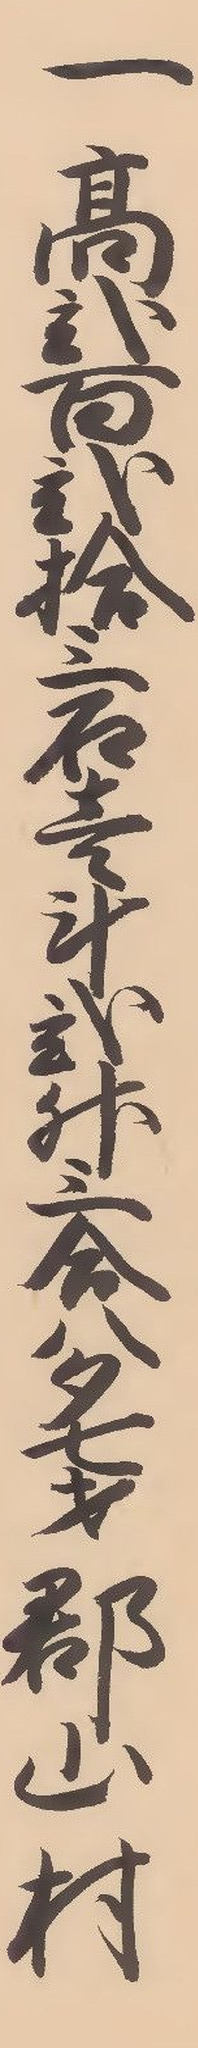一高弐百弐拾三石壱斗弐升三合八勺七才郡山村
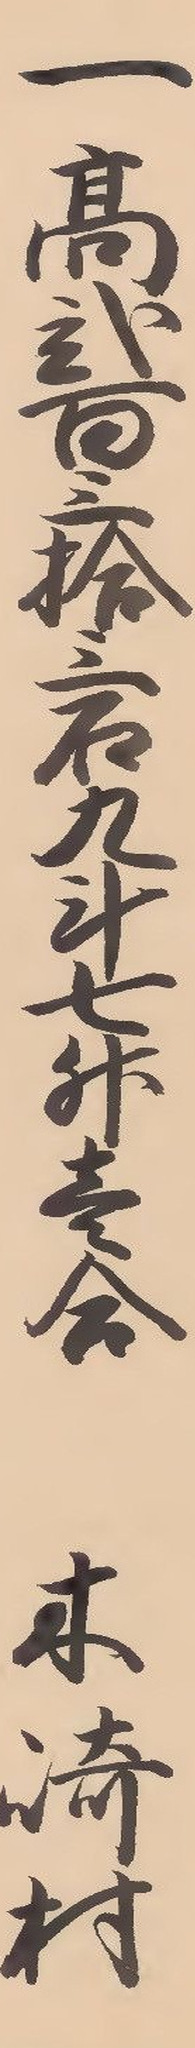一高弐百三拾三石九斗七升壱合木崎村
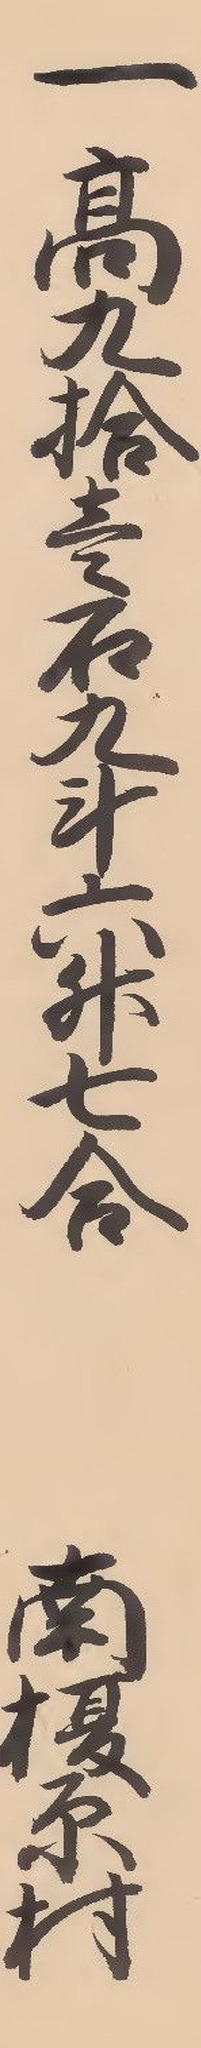一高九拾壱石九斗六升七合南榎原村
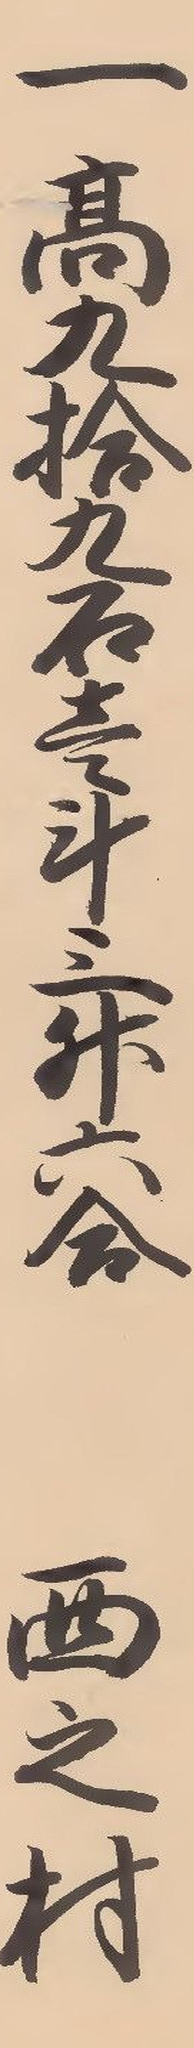一高九拾九石壱斗三升六合西之村
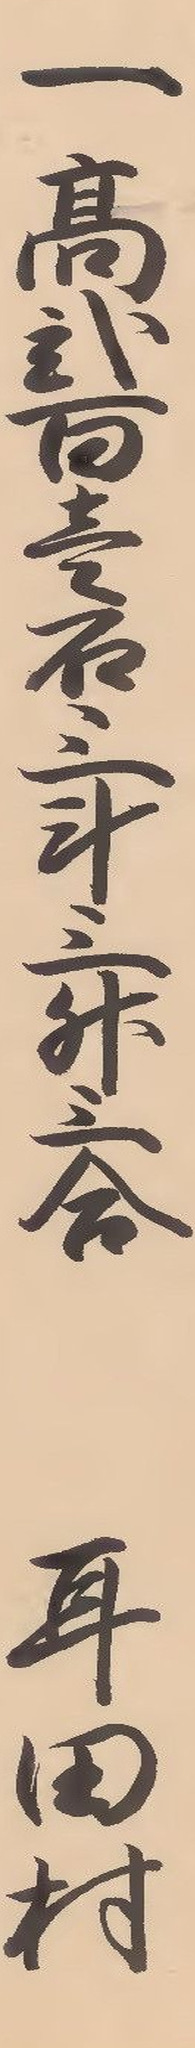一高弐百壱石三斗三升三合耳田村
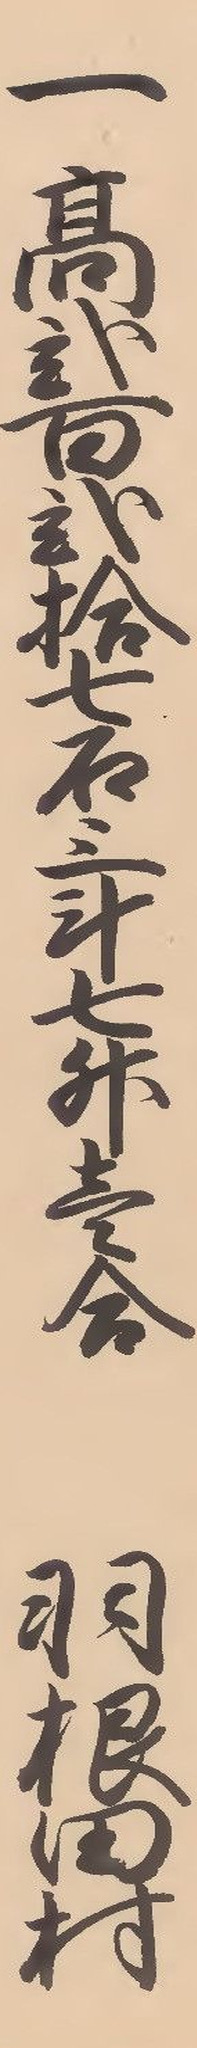一高弐百弐拾七石三斗七升壱合羽根田村
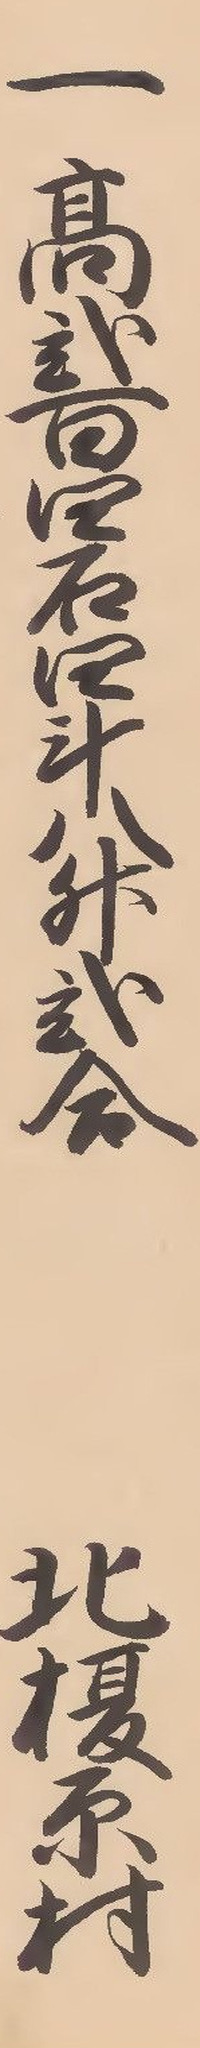一高弐百四石四斗八升弐合北榎原村
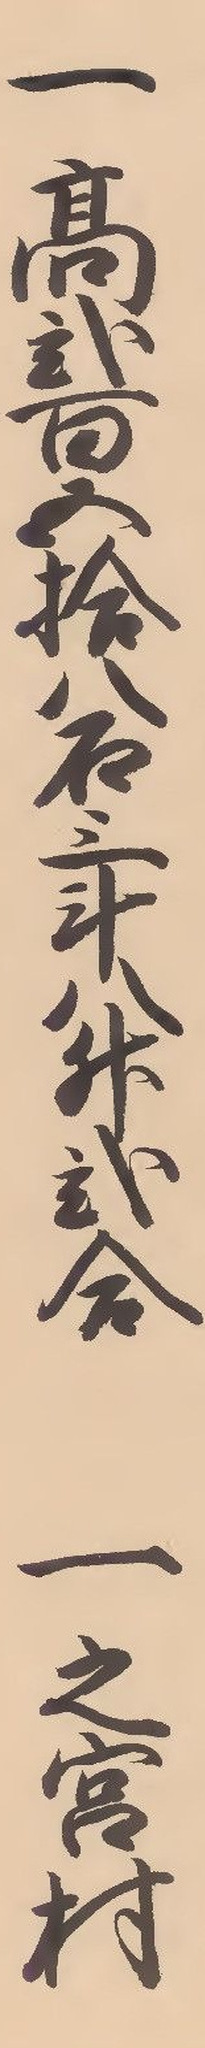一高弐百五拾八石三斗八升弐合一之宮村

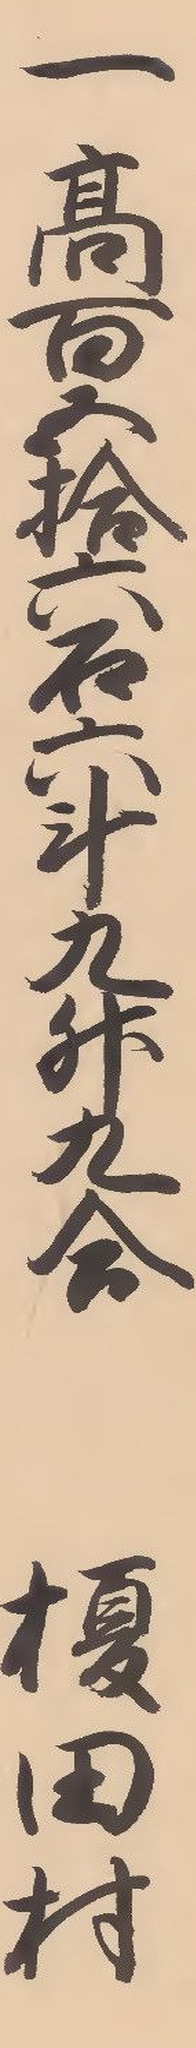一高百五拾六石六斗九升九合榎田村
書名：薩摩国郷帳
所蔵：国立公文書館 National Archives of Japan
